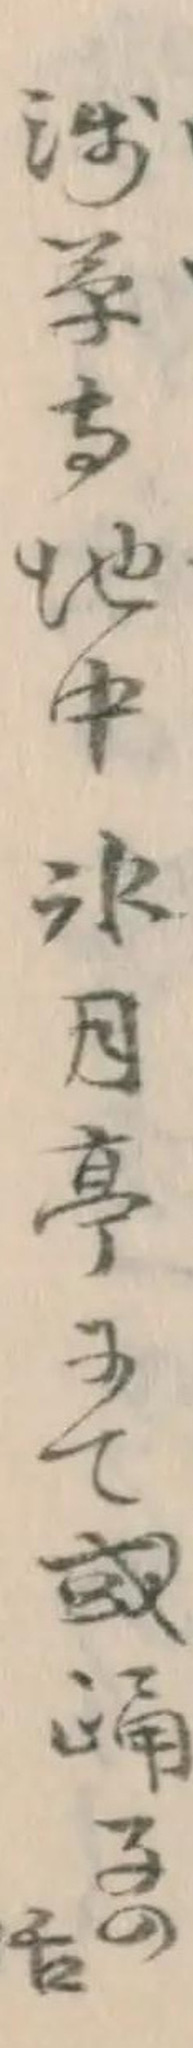浅草寺地中氷月亭にて或踊子の話
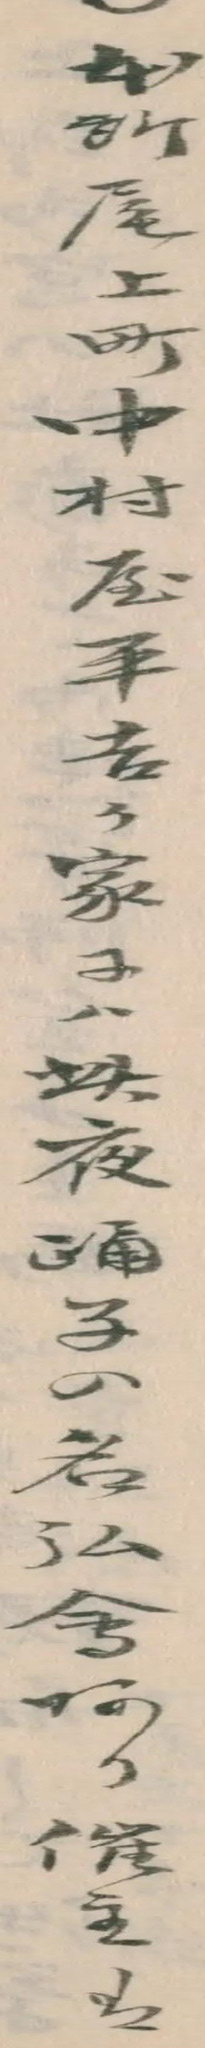〇本所尾上町中村屋平吉か家には此夜踊子の名弘会あり催主は
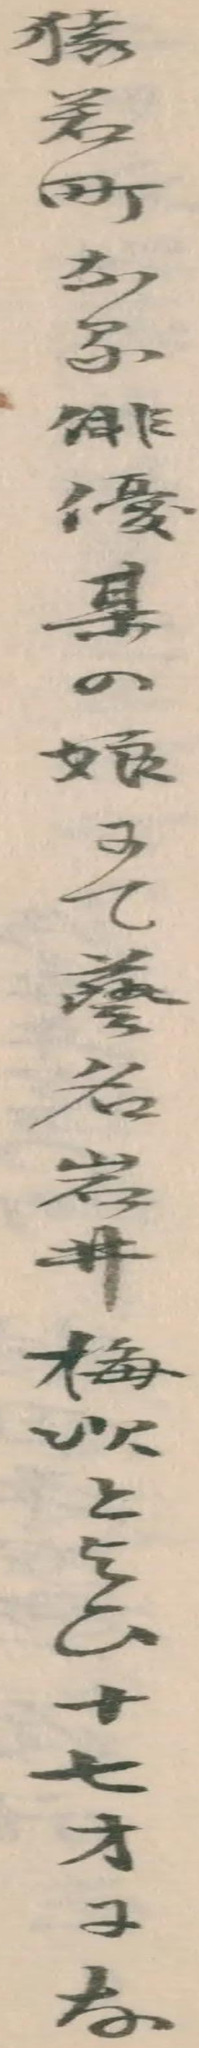猿若町なる俳優某の娘にて芸名岩井梅次とよひ十七才にな
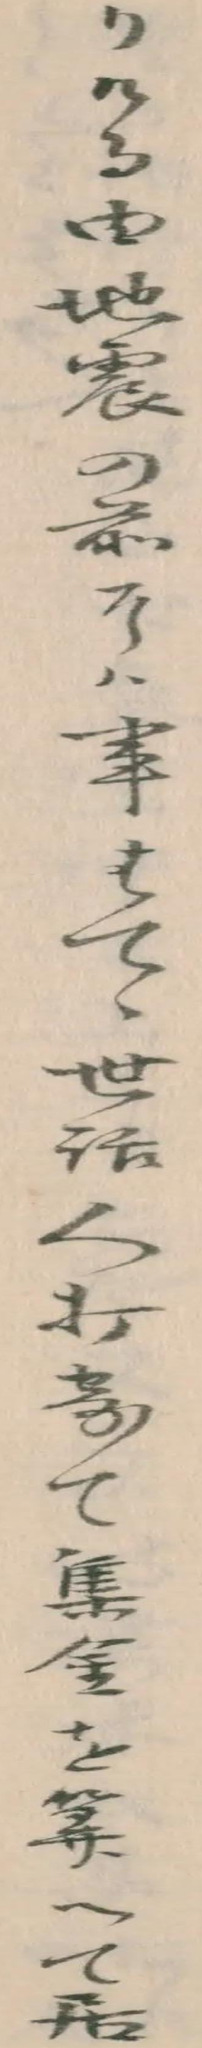りける由地震の前には事はてゝ世話人打寄て集金を算へて居
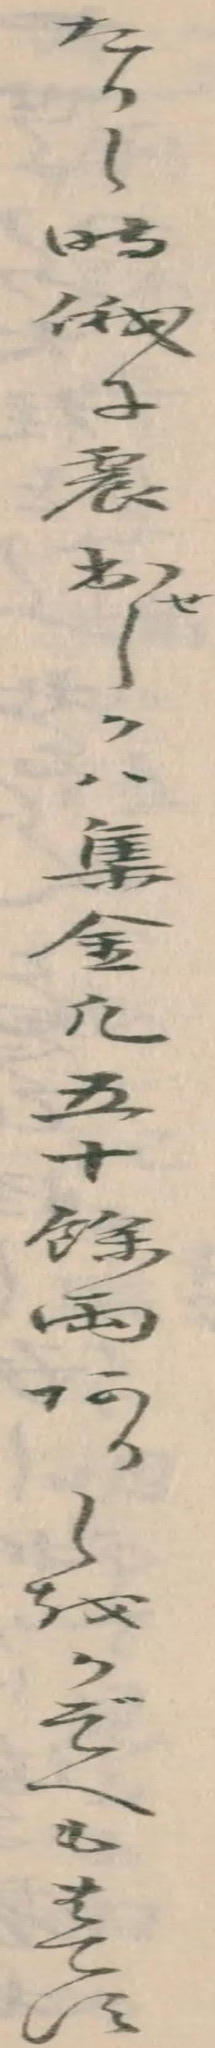たりし時俄に震出せしかは集金凡五十余両ありしをかぞへもはてす
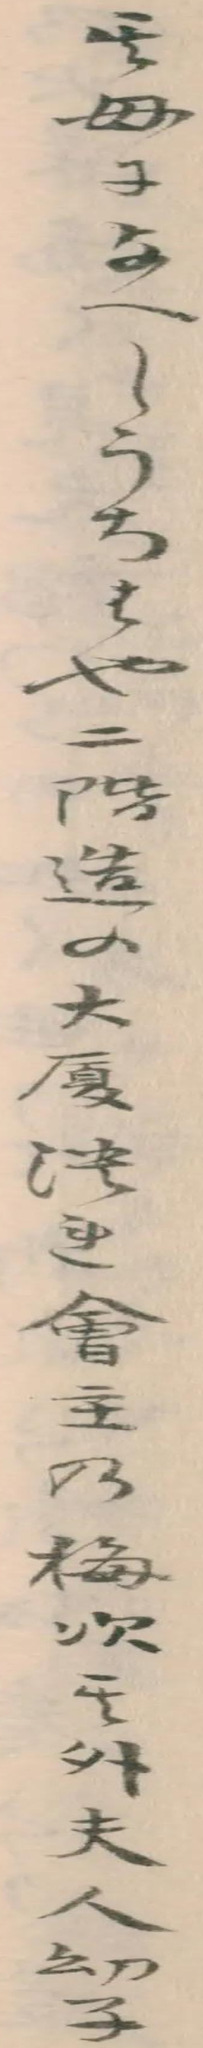其母に与へしうちはや二階造の大厦潰れ会主の梅次其外夫人幼子
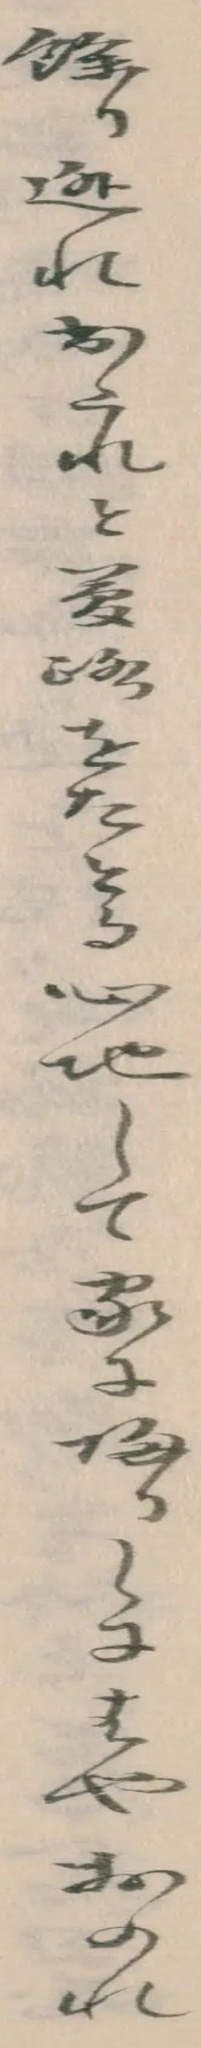余り逃れ出たれと夢路をたとる心地して家に帰りしにはやおのれ
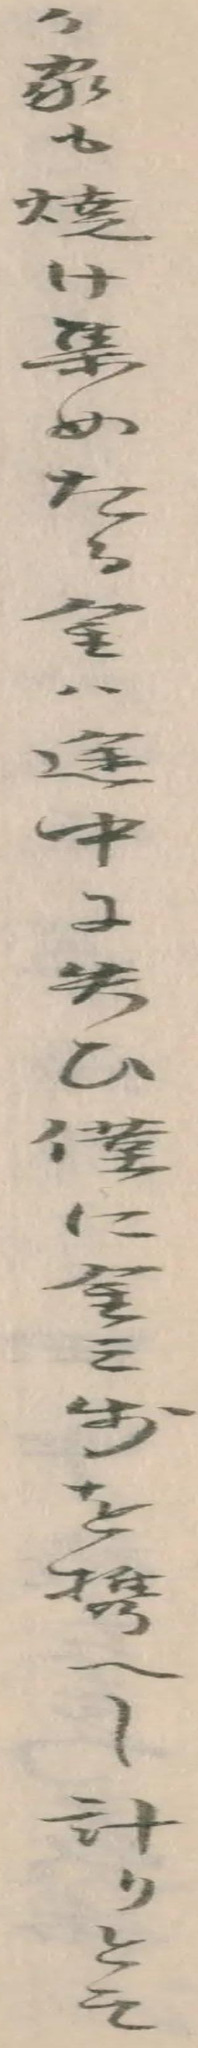か家も焼け集めたる金は途中に失ひ僅に金三歩を携へし計りとそ
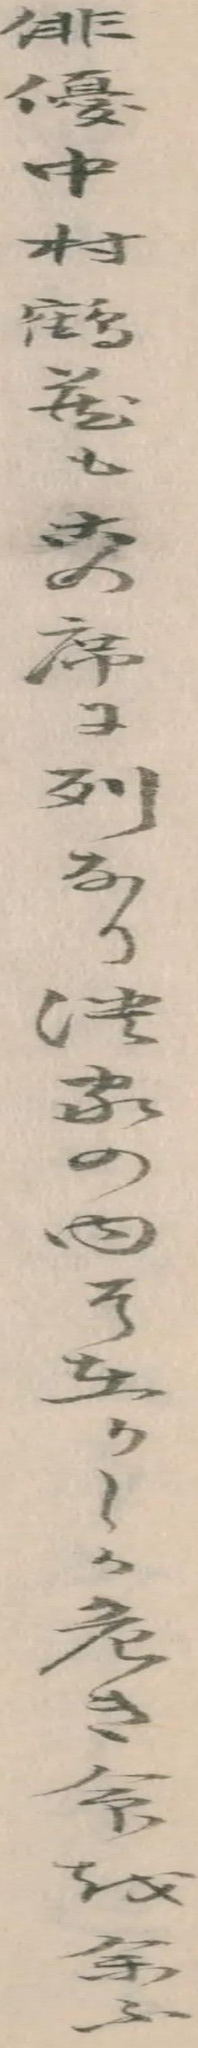俳優中村鶴蔵もこの席に列なり潰家の内に在りしか危き命をよふ
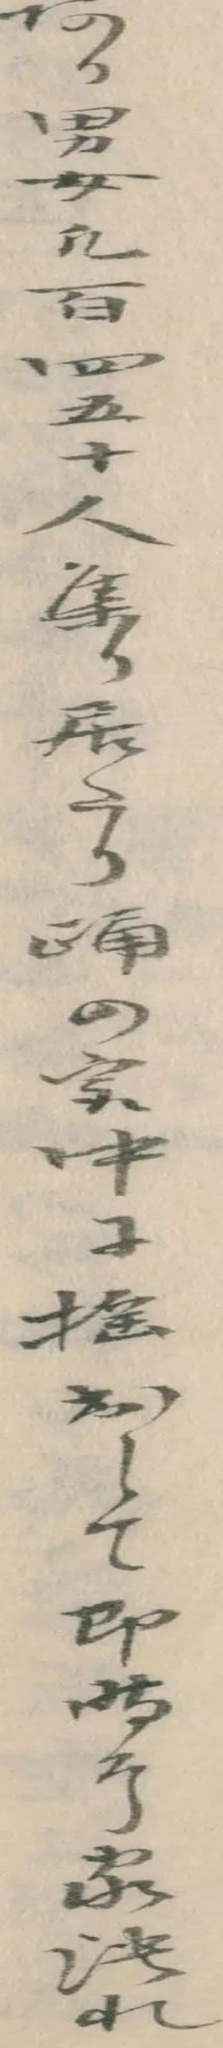あり男女凡百四五十人集り居たり踊の最中に揺出して即時に家潰れ

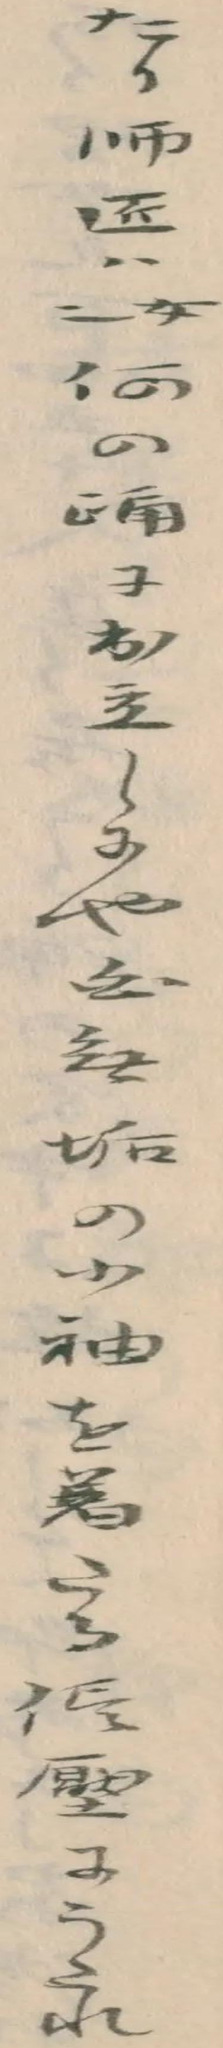たり師匠は女ニ何の踊子出立しにや白無垢の小袖を着たる儘圧にうたれ
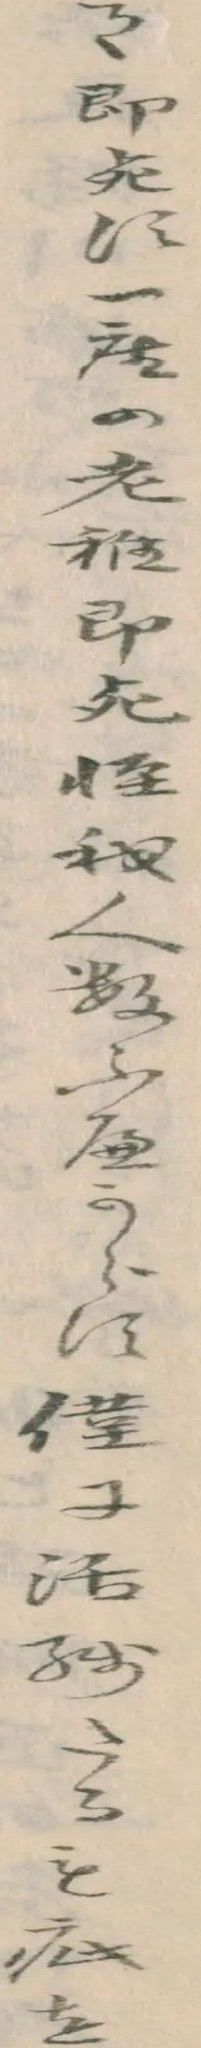て即死す一座の老稚即死怪我人数ふへからす僅に活残たるも疵を
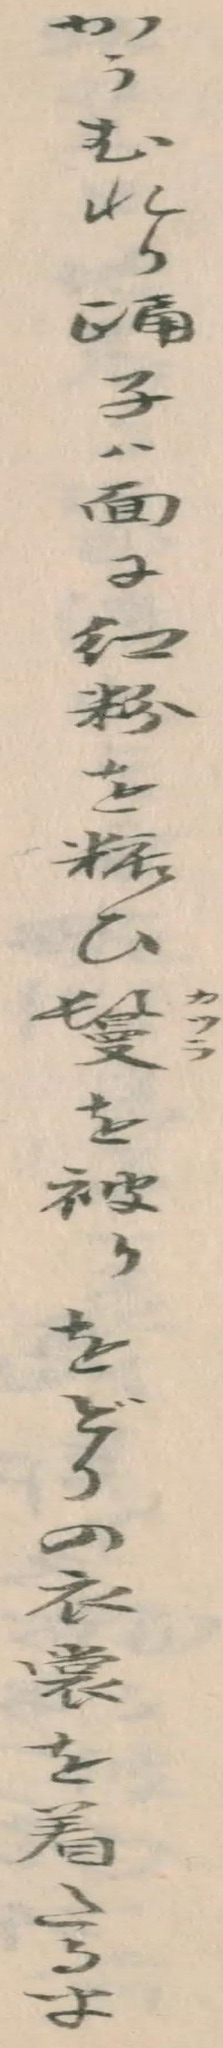かうむれり踊子は面に紅粉を粧ひ鬘を被りをどりの衣裳を着たるま
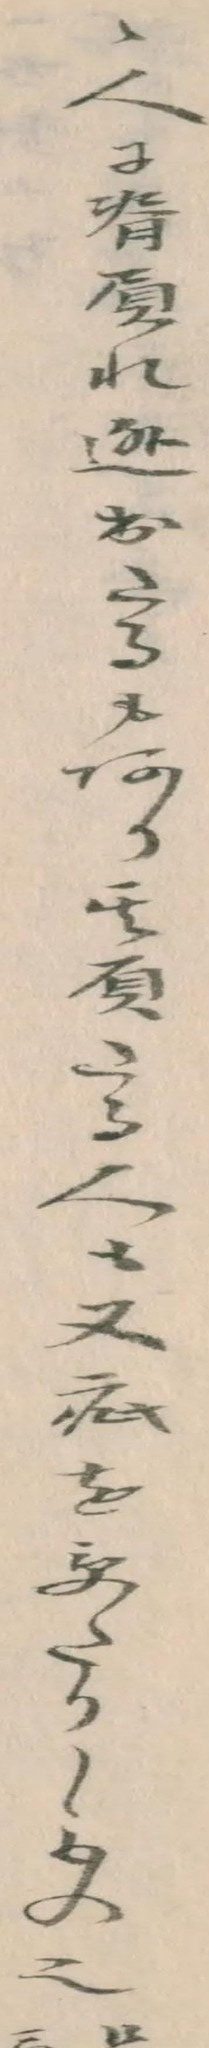ゝ人に脊負れ逃出たるもあり其負たる人も又疵を受たりしもの也是は踊の
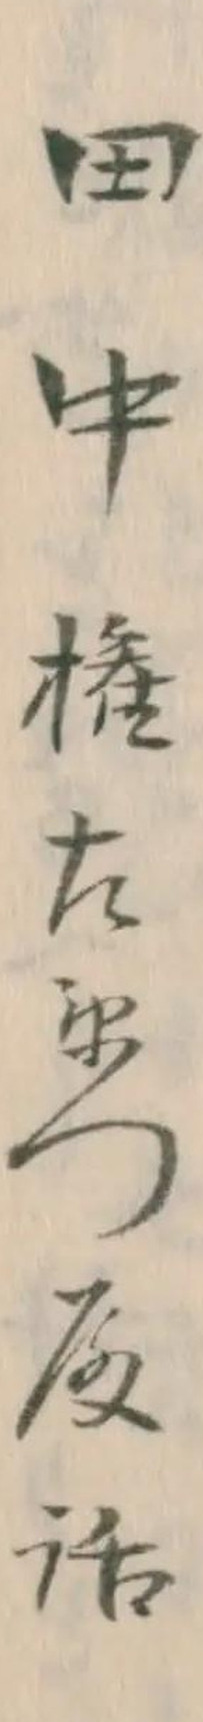芝田中権左衛門殿話
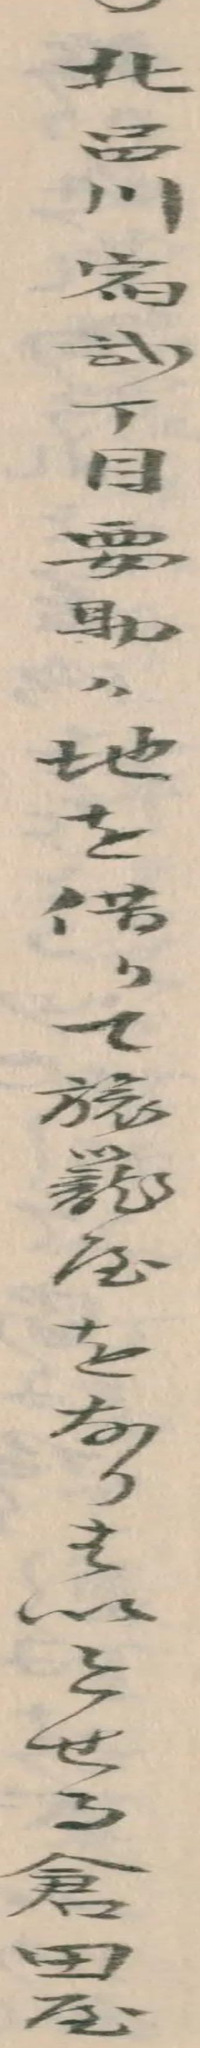〇北品川宿弐丁目要助か地を借りて旅籠屋をなりはいとせる倉田屋
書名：地災撮要. 巻7-9(地震之部)
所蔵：国立国会図書館 National Diet Library, JAPAN
